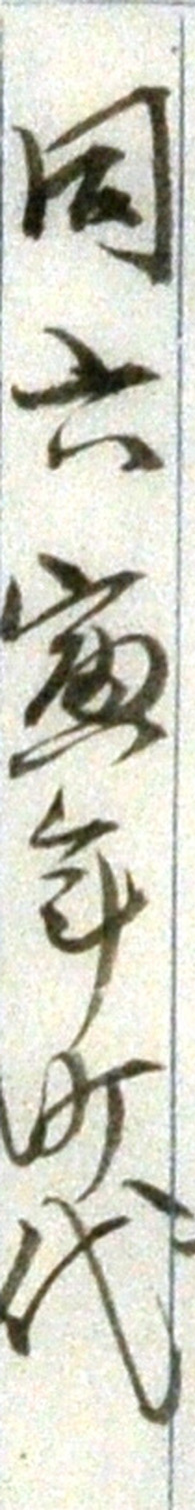同六寅年町代
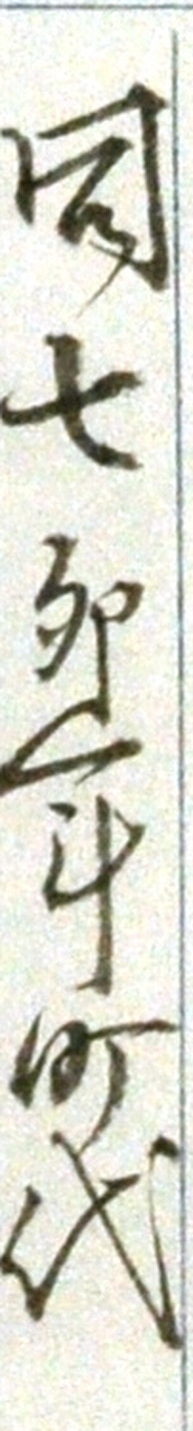同七卯年町代
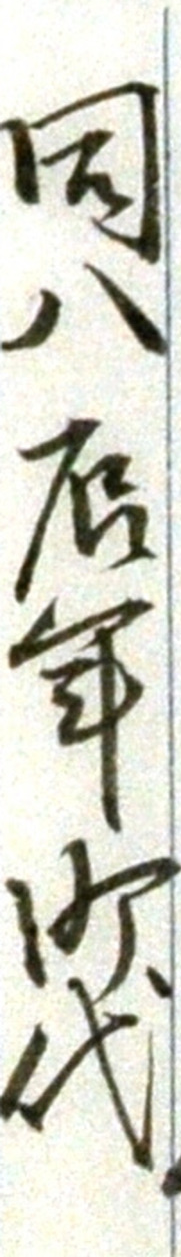同八辰年町代
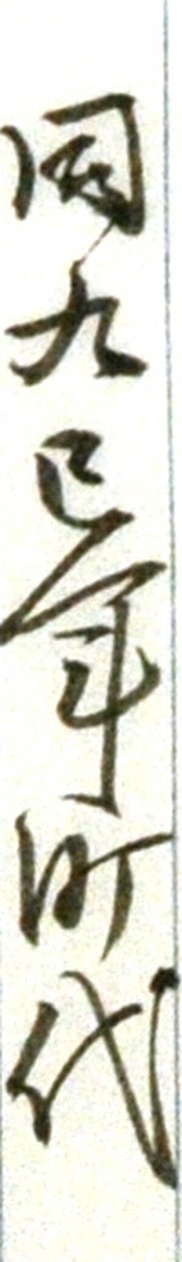同九巳年町代
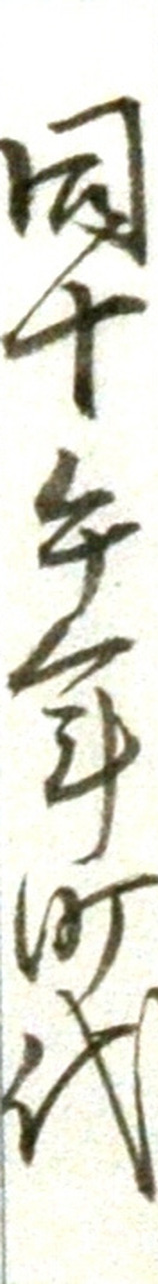同十午年町代

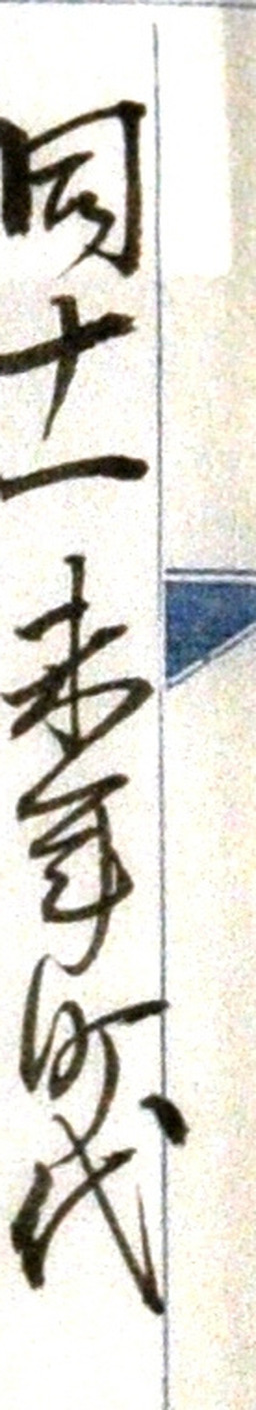同十一未年町代
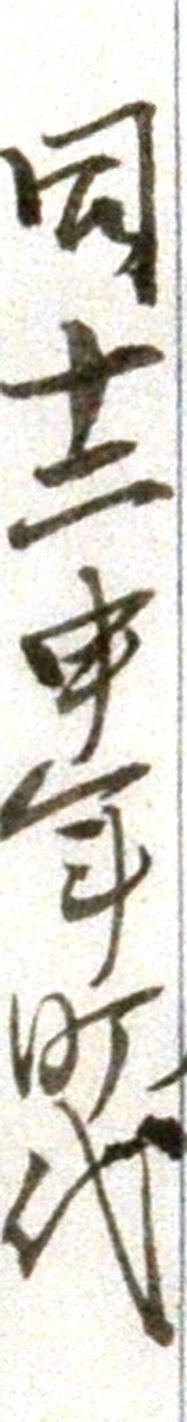同十二申年町代
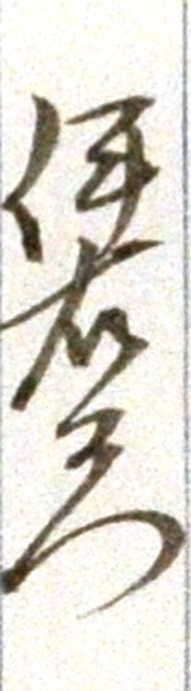又右衛門
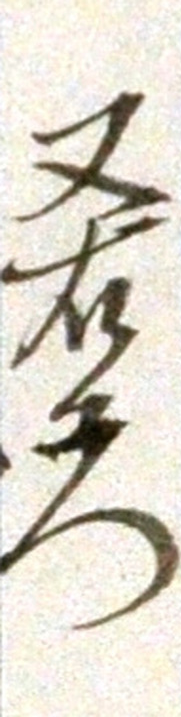又右衛門
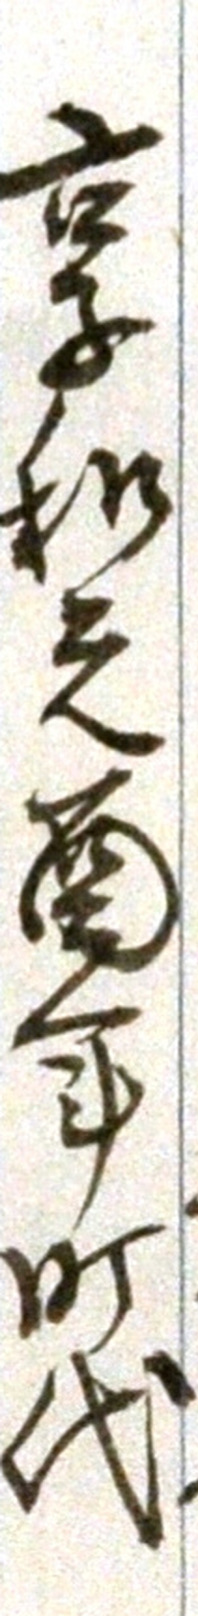享和元酉年町代
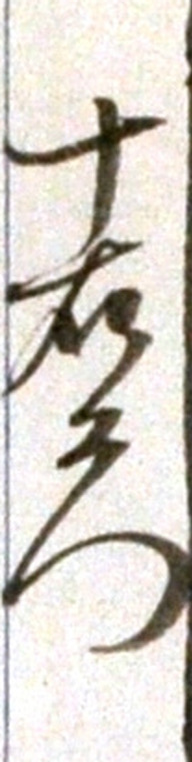又右衛門
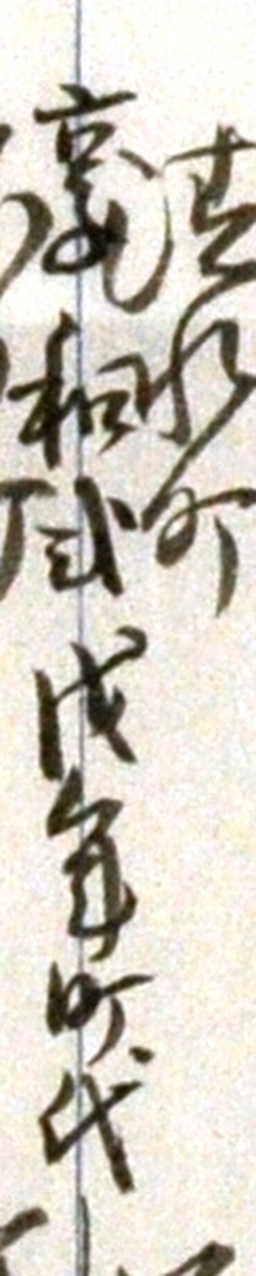享和弐戌年町代
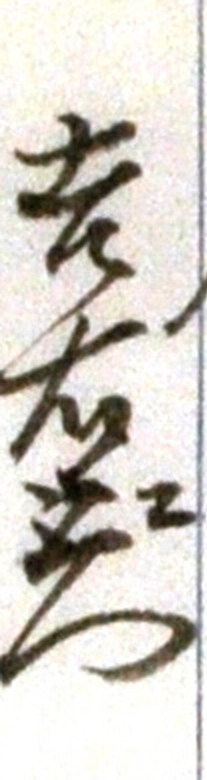又右衛門
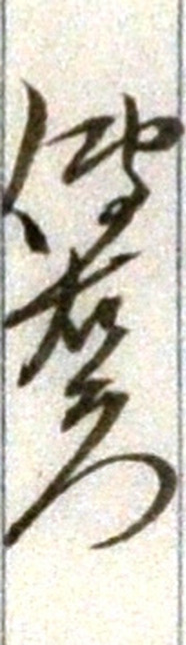又右衛門
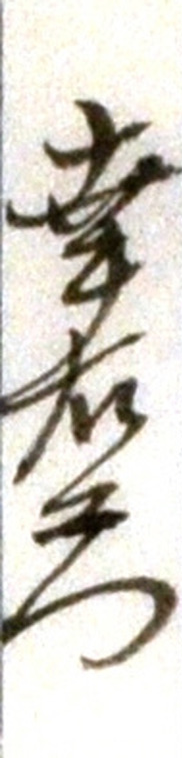又右衛門
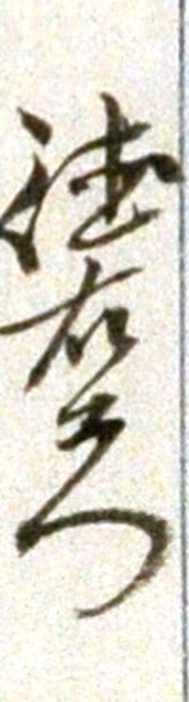又右衛門
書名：町方町代名前書
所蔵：伊那市立高遠町図書館・合同会社AMANE
